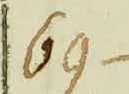69
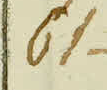61
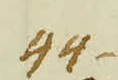44
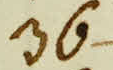36
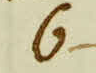6
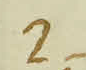2
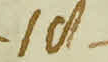18
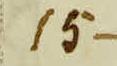15
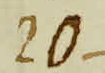20
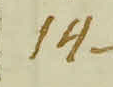14
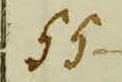55
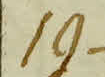19
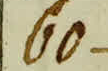60
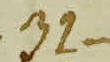32
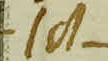18
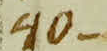40
